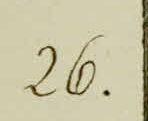26.
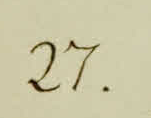27.
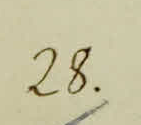28.
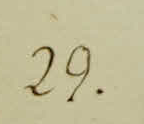29.
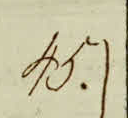45.
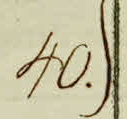40.
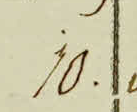10.
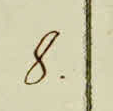8.
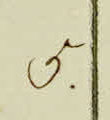5.
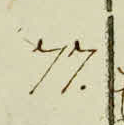77.
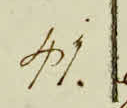41.
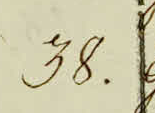38.
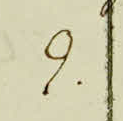9.
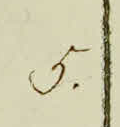5.
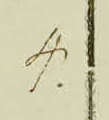4.
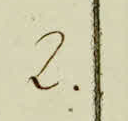2.
